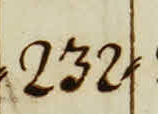232
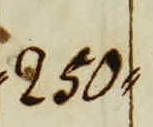250
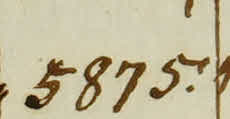5875.
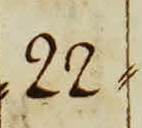22
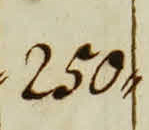250
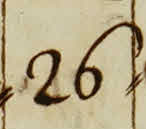26
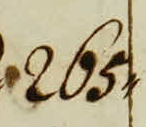265
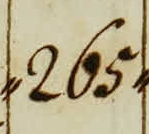265
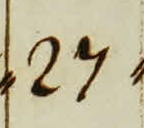27
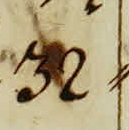32
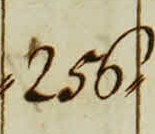256
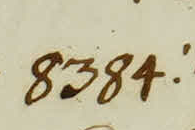8384
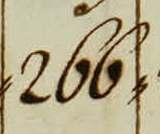266
